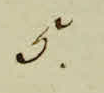5.
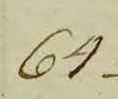64
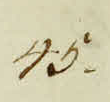45
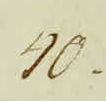40
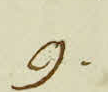9
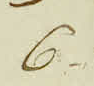6
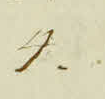4.
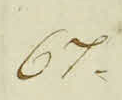67
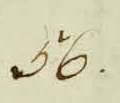56
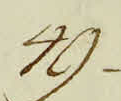49
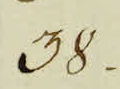38
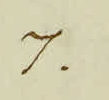7.
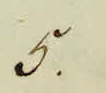5.
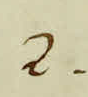2
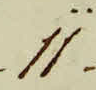11
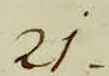21
